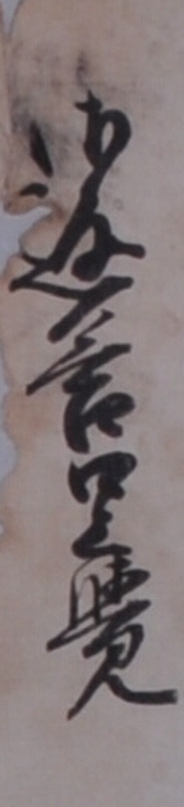御返答口上覚
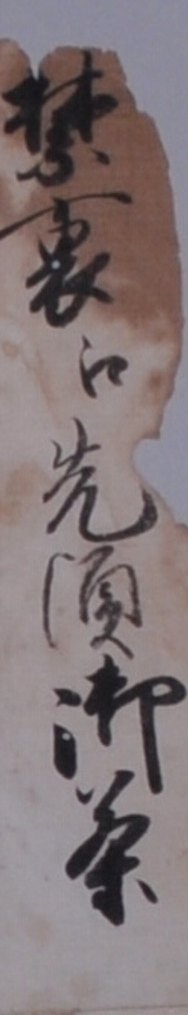禁裏え先頃御茶
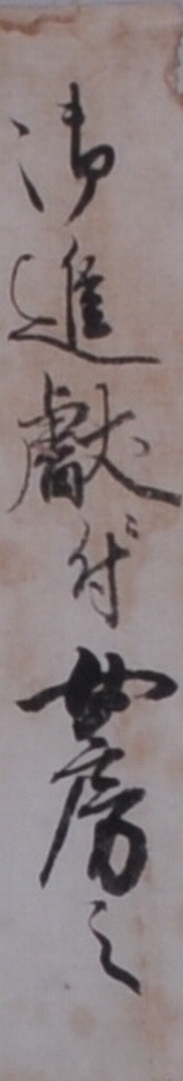御進献に付女房之
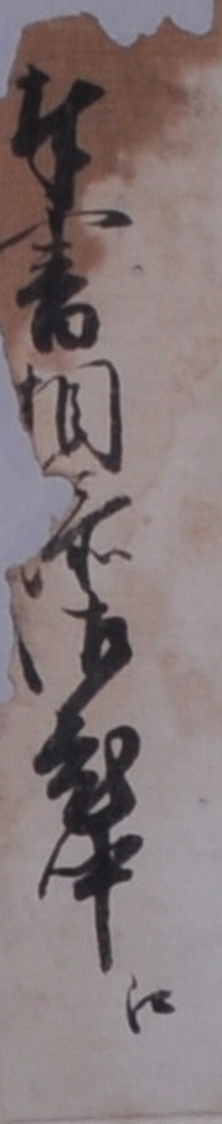奉書相添御老中え
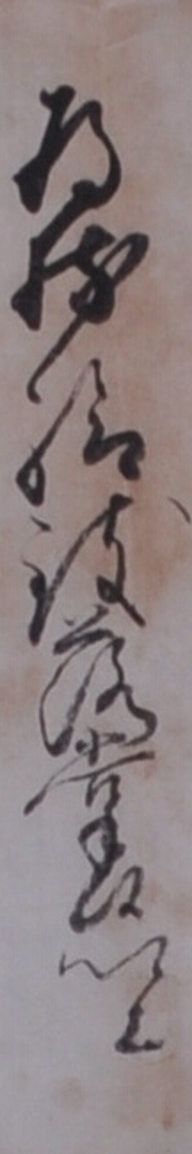為持給致落掌候以上
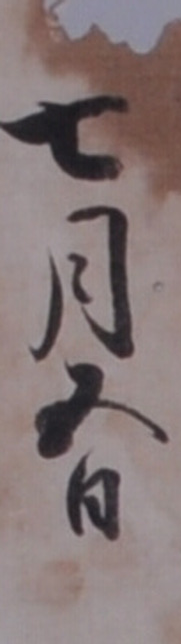七月五日
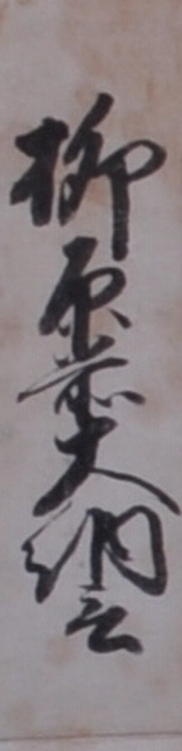柳原前大納言
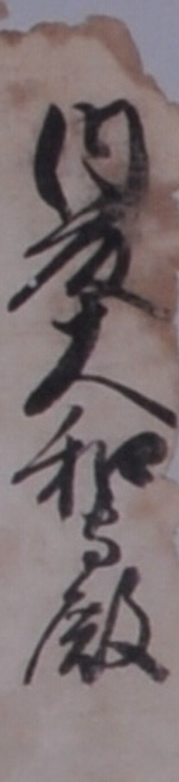内藤大和守殿
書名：御返答口上覚
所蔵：伊那市立高遠町図書館・合同会社AMANE
